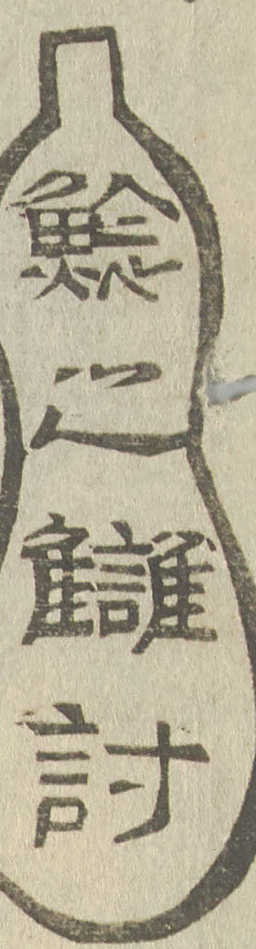鯰之讎討
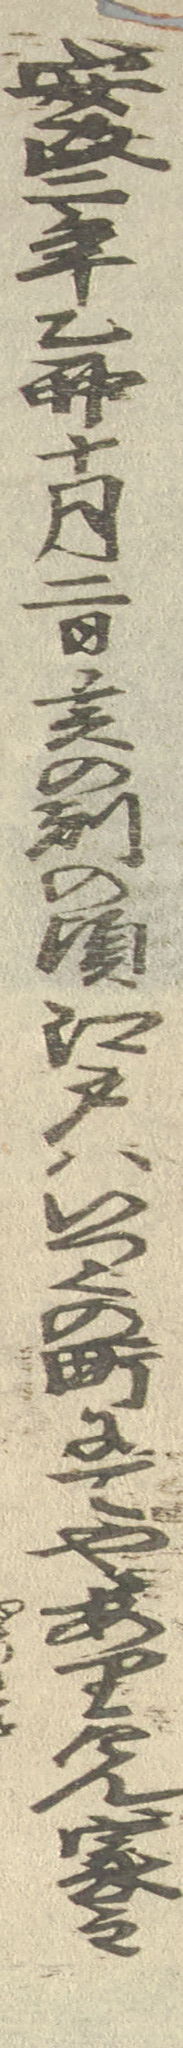安政二年乙卯十月二日亥の刻の頃江戸ハいつくの町にてやありけん家主
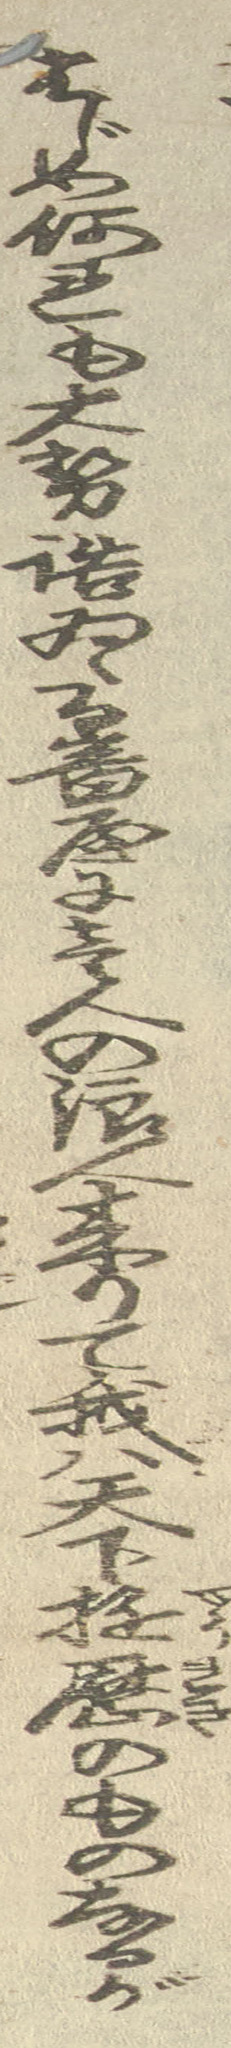はじめ何れも大勢詰ゐたる番屋に壱人の浪人来りて我ハ天下遊歴のものなるが
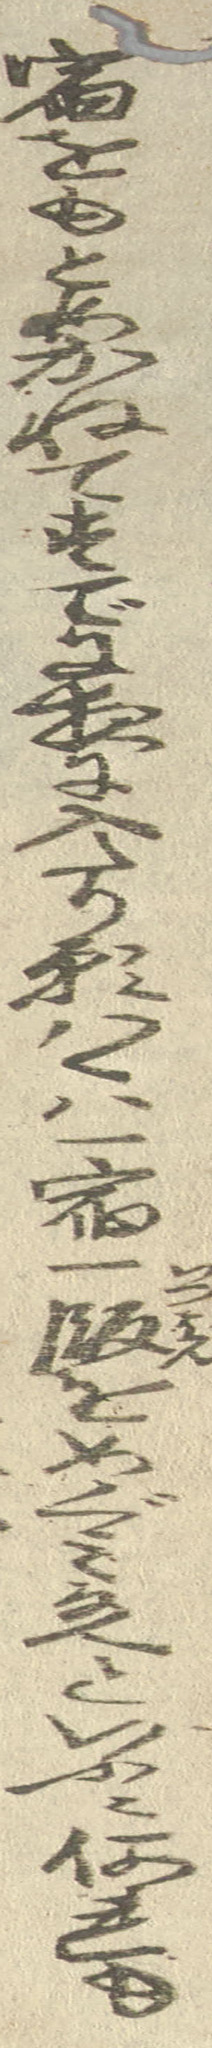宿をもとめかねてすでに夜に入たり願ハくハ一宿一飯をめぐミ給へといふニ何れも
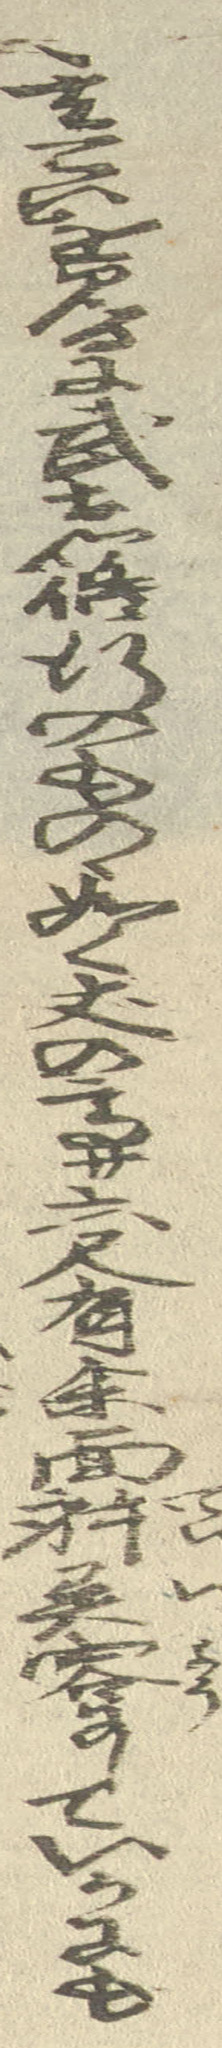其ていを見るに武者修行のものゝ如く丈の高サ六尺有余面躰異容にしていかにも
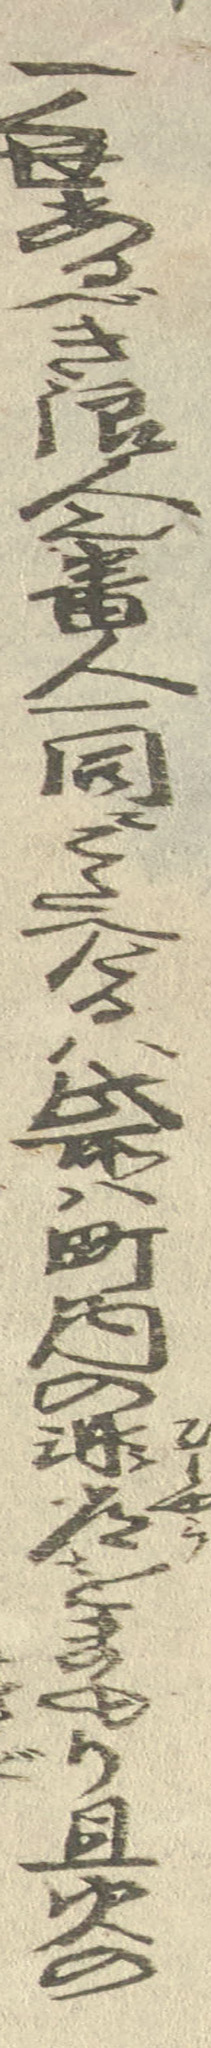一くせあるべき浪人也番人一同ニこたへけるハ此所ハ町内の非常をまもり且火の
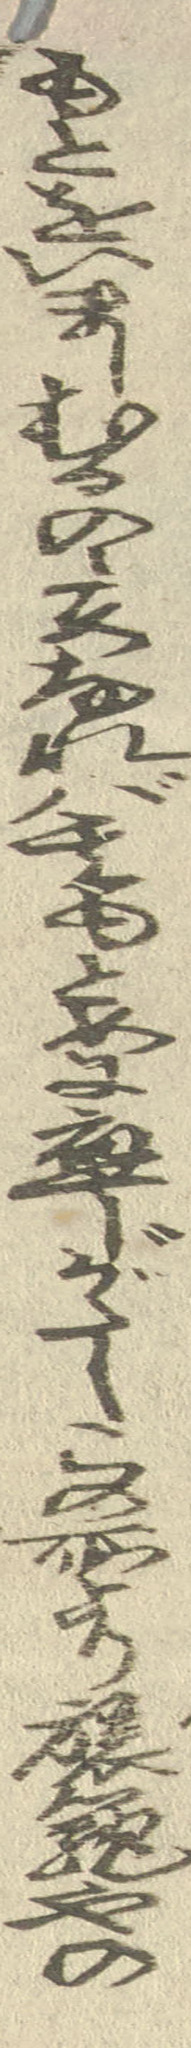もとをいましむるのためなれバ其もとめに応じがたしこの所より旅籠やの
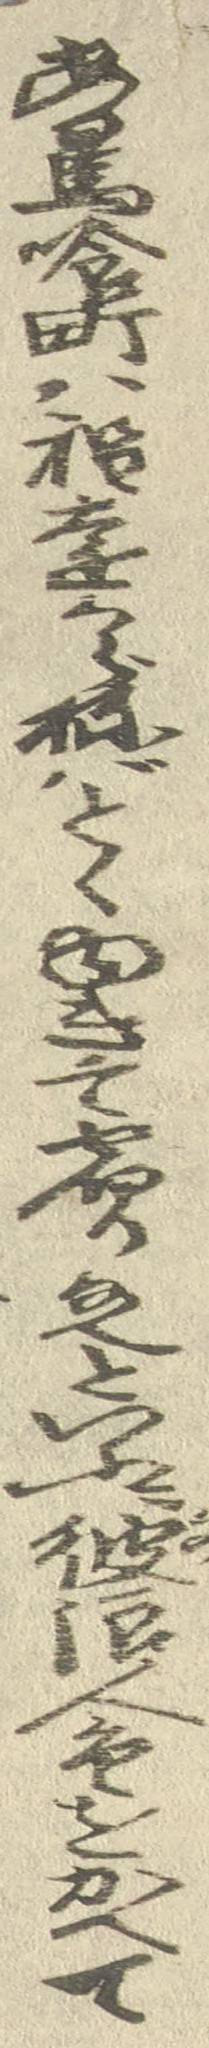ある馬喰町ハ程遠からねバとくゆきて宿り給へといふニ彼浪人色をかへて
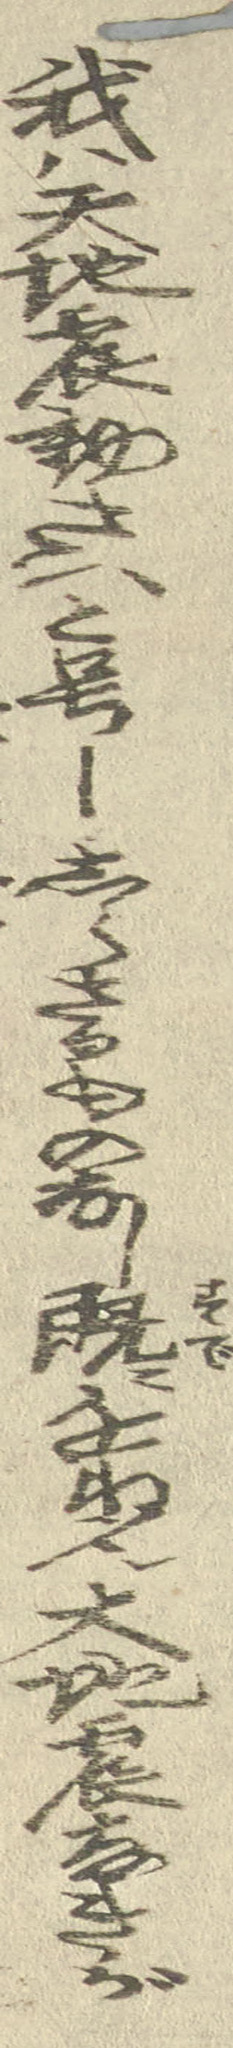我ハ天地震動さいと号ししらさるものなし既ニ近ねん大地震なきが
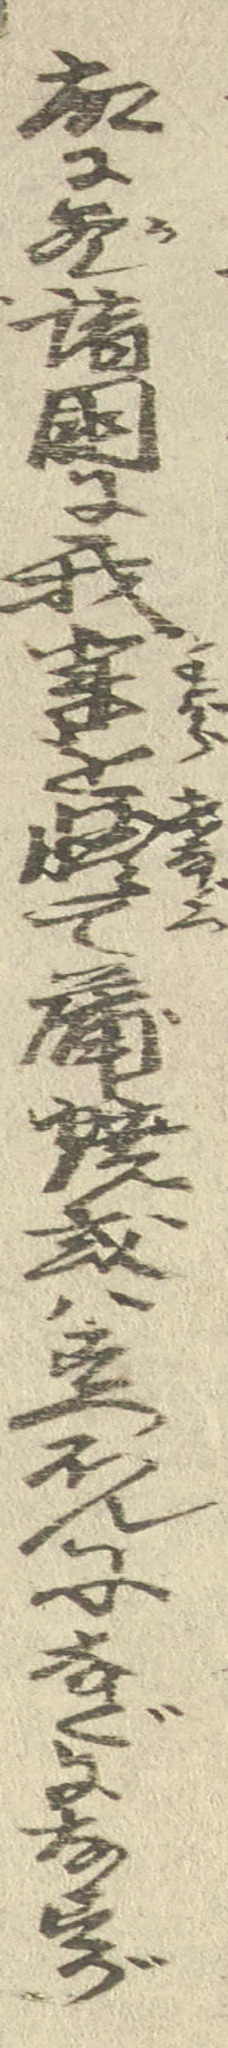故に歟諸国に我輩を慢て蒲焼或いハすつほんになどになすが
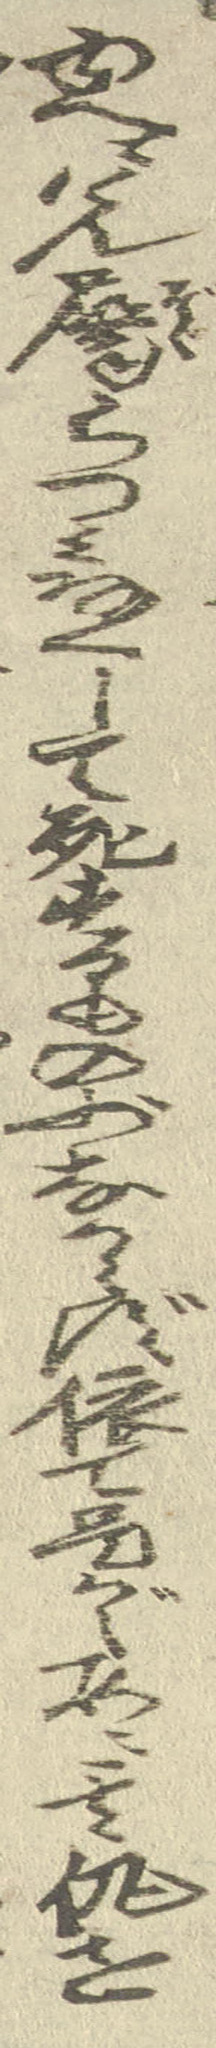ゆへニけん属らつミなくして死するもの少なからず依て是がためニ其仇を
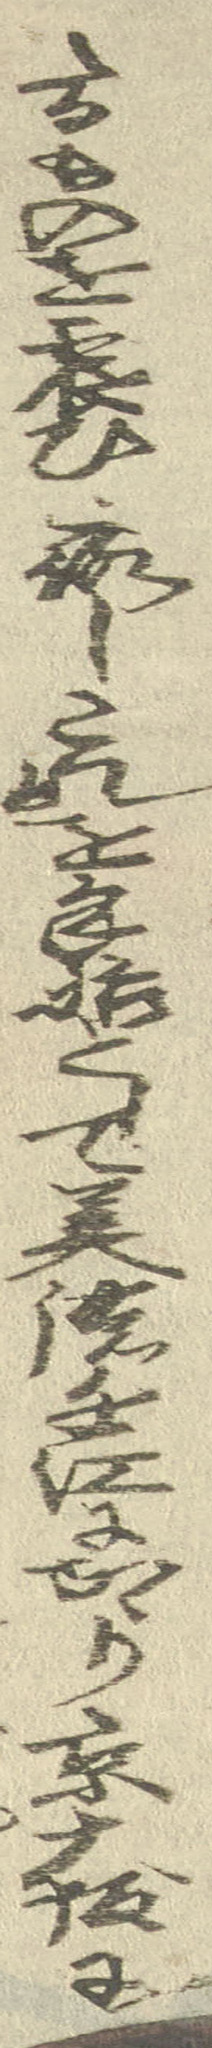たるものを震ひ落しこれを手始として美濃近江にかゝり京大坂に
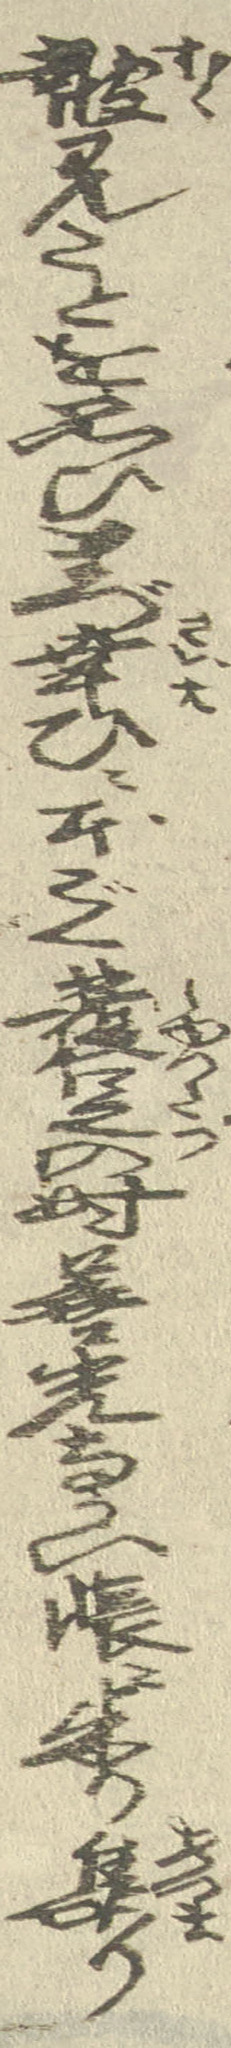報わんことを思ひまづ幸ひニ本ごく発足の時善光寺かい帳ニ来り集り
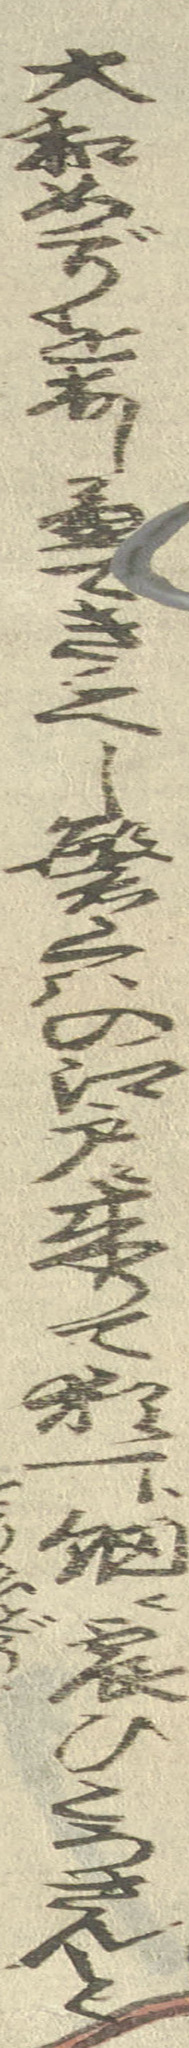大和めぐりをなし兼てきこへし繁くハの江戸ニ来りて猶一ト網ニ震ひころさんと
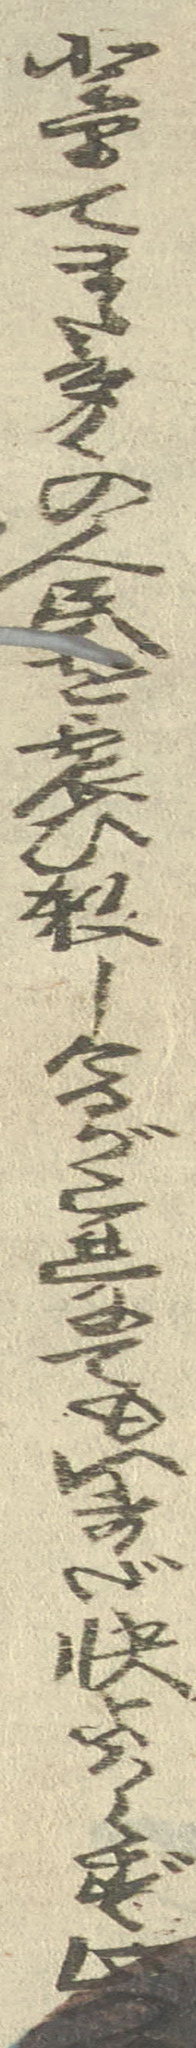登りてまた多くの人民を震ひ殺しけるがわれにてもいまだ快よからず此ついで
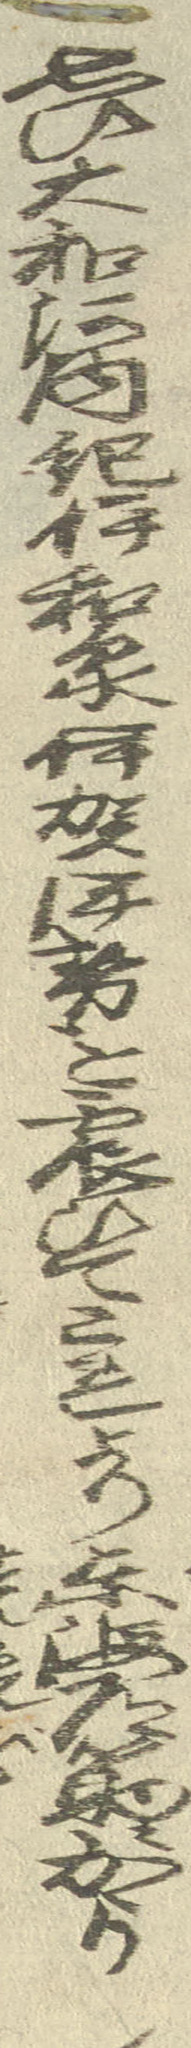思ひ大和河内紀伊和泉伊賀伊勢を震ひてこれより東海道筋ニかゝり
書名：鯰之讎討
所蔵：東京大学総合図書館 General Library in the University of Tokyo, JAPAN
